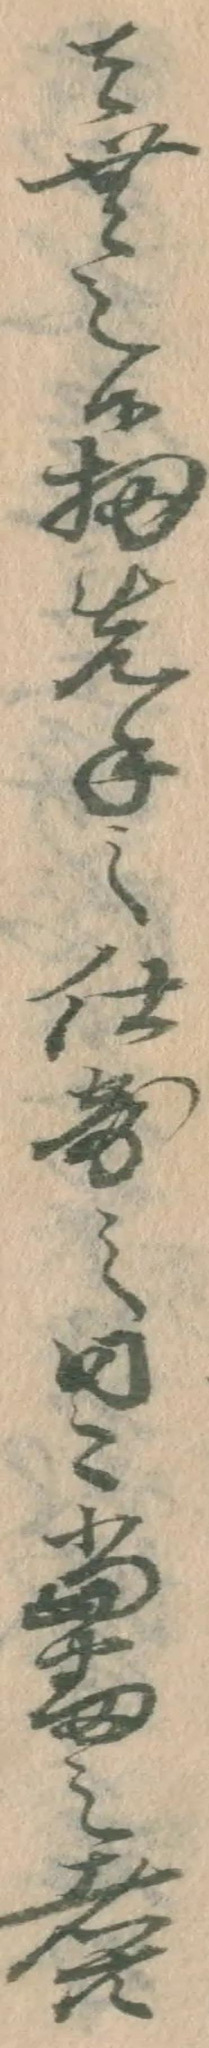を無之候扨先手之仕寄之内に当番之者共
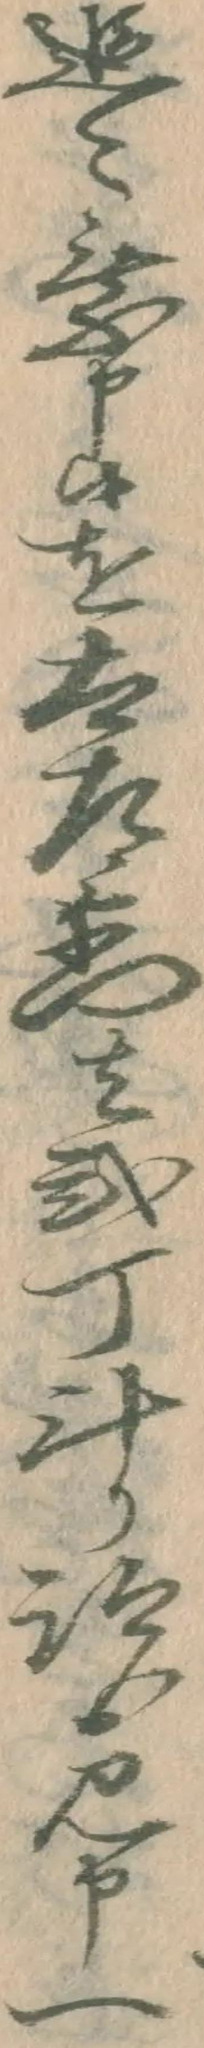追々乗申候を太左衛門者弐丁斗り跡ゟ見申一
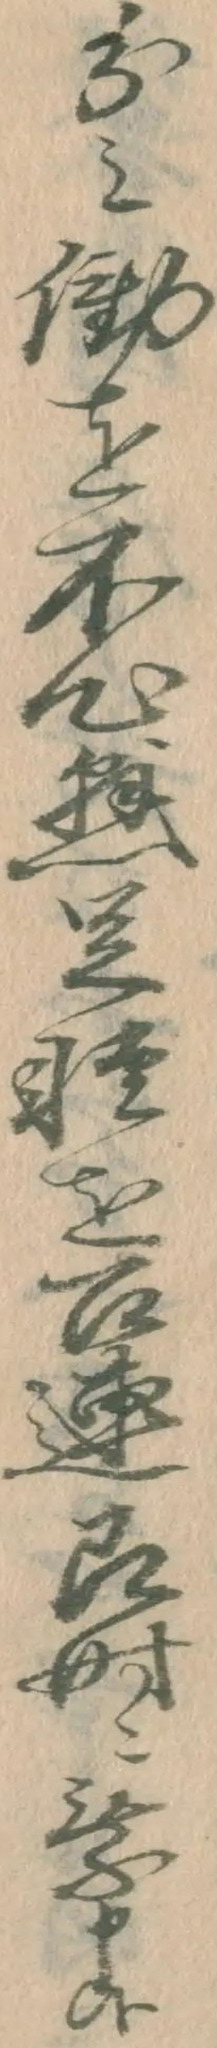分之働を不心懸足軽を召連即時に乗申候

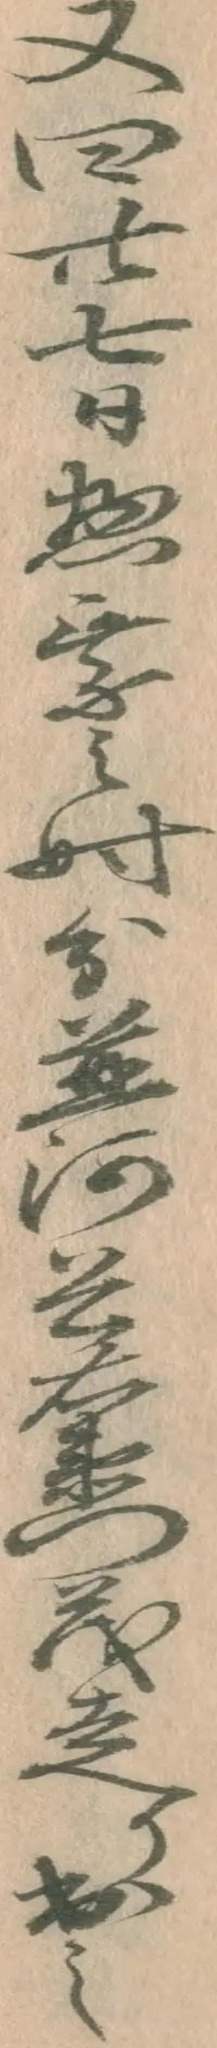又曰廿七日惣乗之時分並河兵右衛門茂走り出し
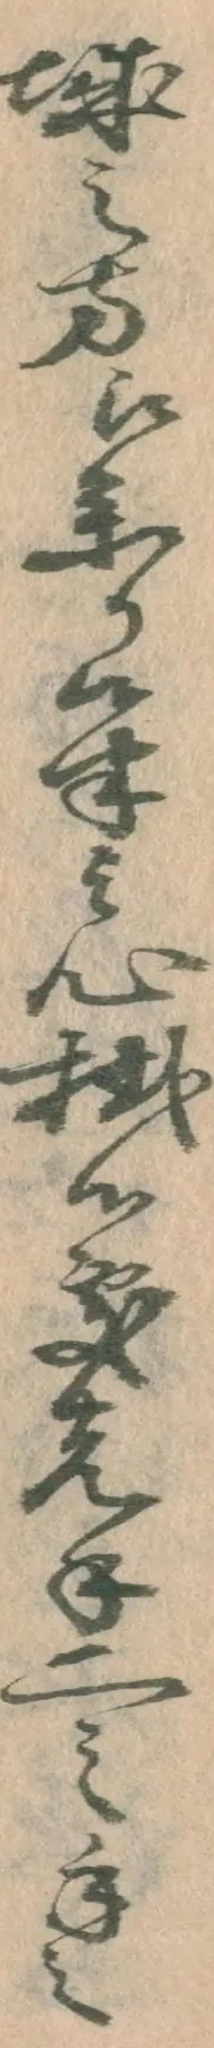城之方江参り候半与心掛候處先手二之手之
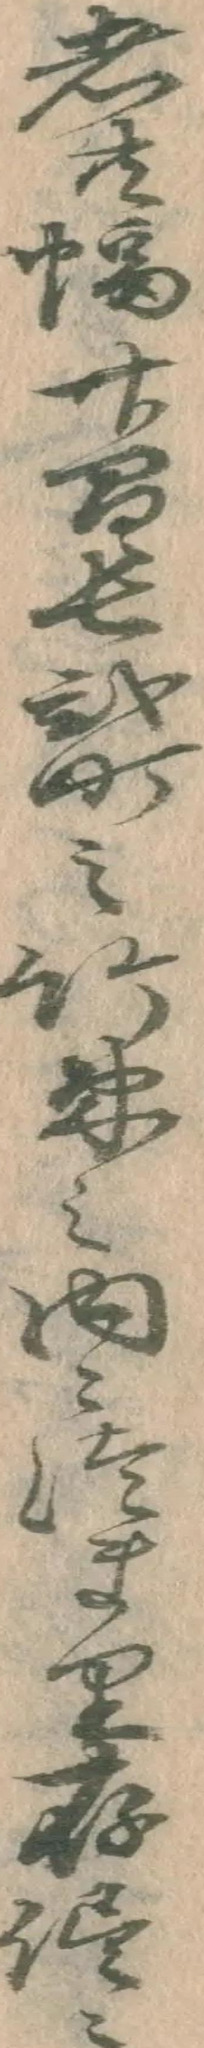者共幅廿間長弐町之竹束之内に徒ま里存侭に
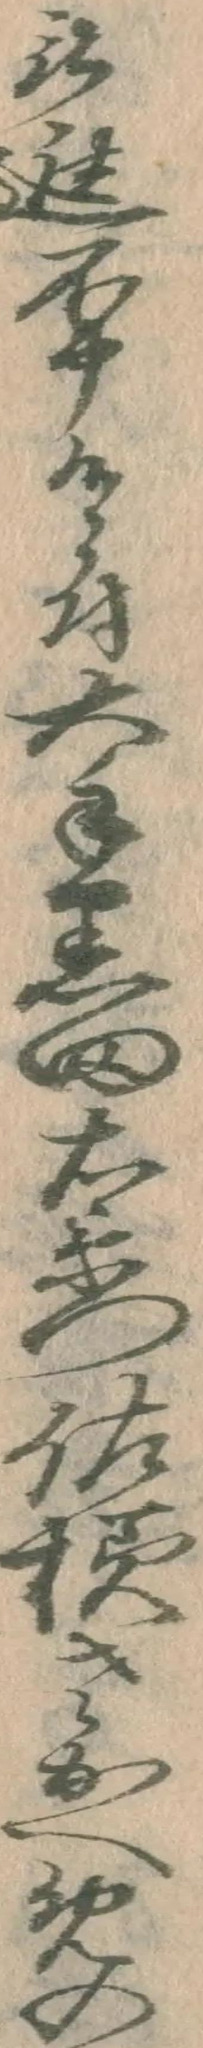被進不申候に付大手黒田右衛門佐様さかへ免の
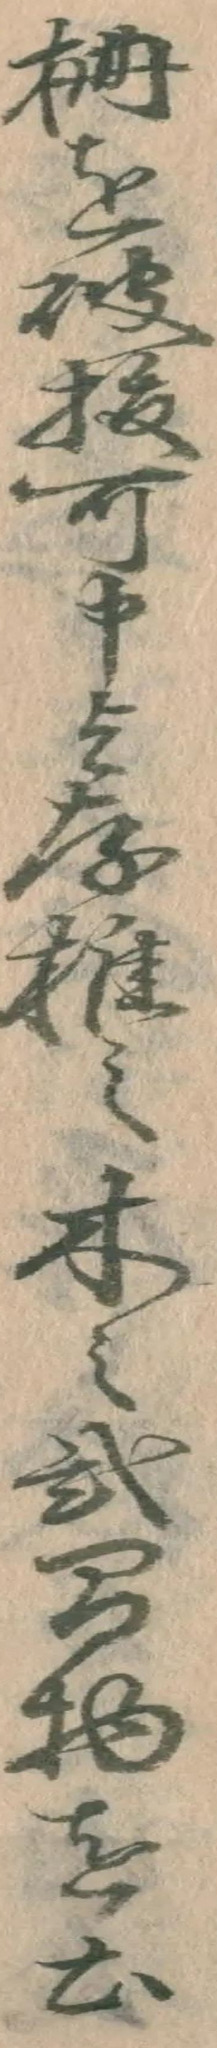柵を破抜可申与存椎之木之弐間物を土
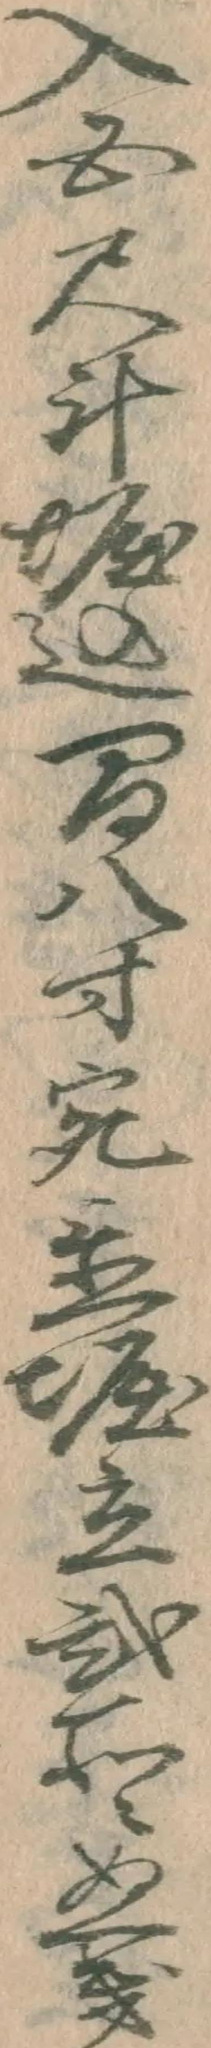入五尺斗堀込間八寸宛置堀立弐所に怒幾
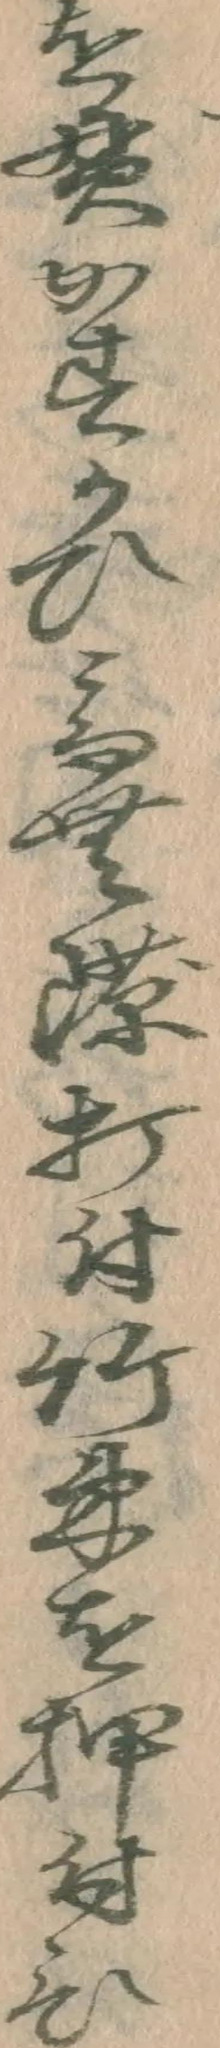を貫か春かひに而無隙打付竹束を押付飛
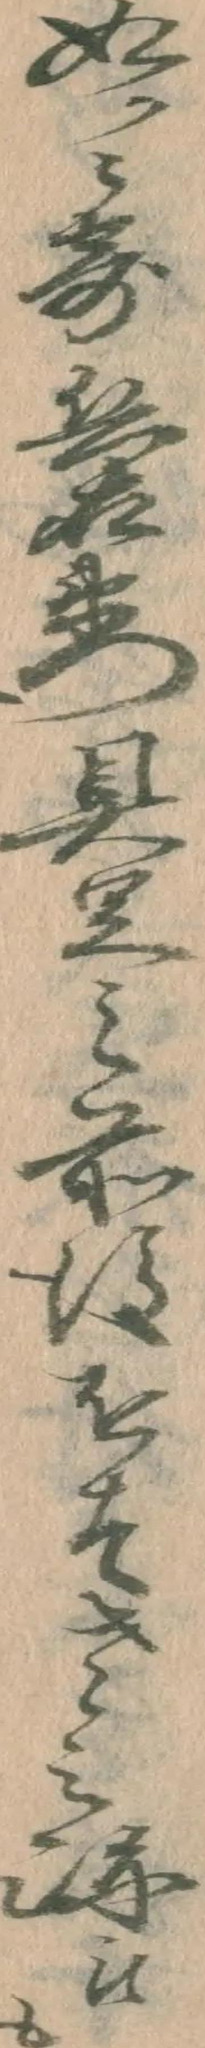し如くに寄兵右衛門具足之前後を者さみ跡江も
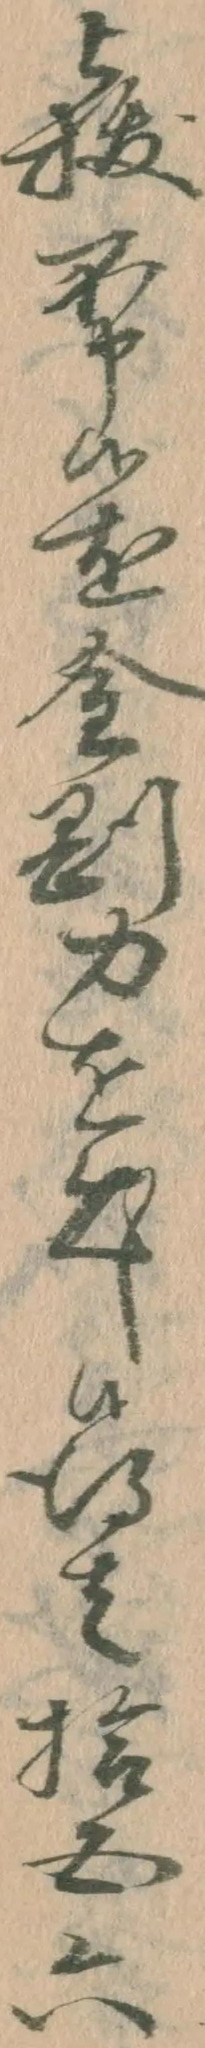被抜不申候を金剛力を出し候得者縦五六
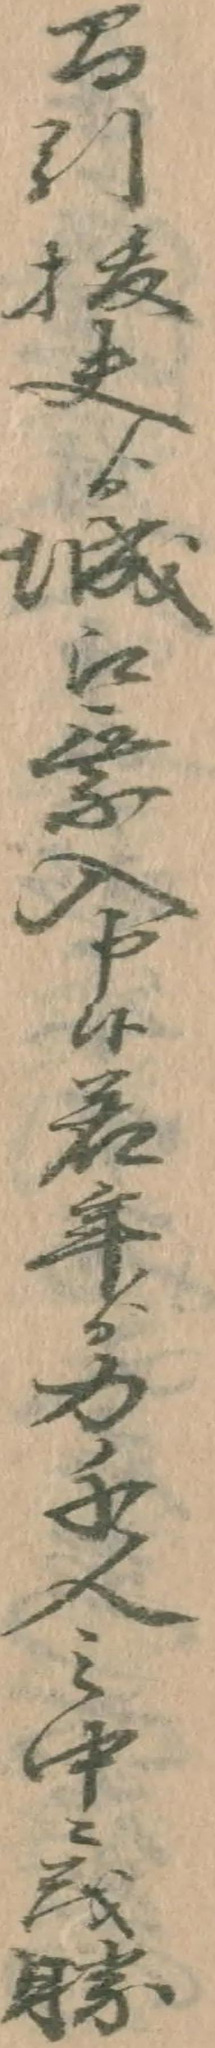間引抜夫ゟ城江乗入申候若年ゟ力千人之中に茂勝
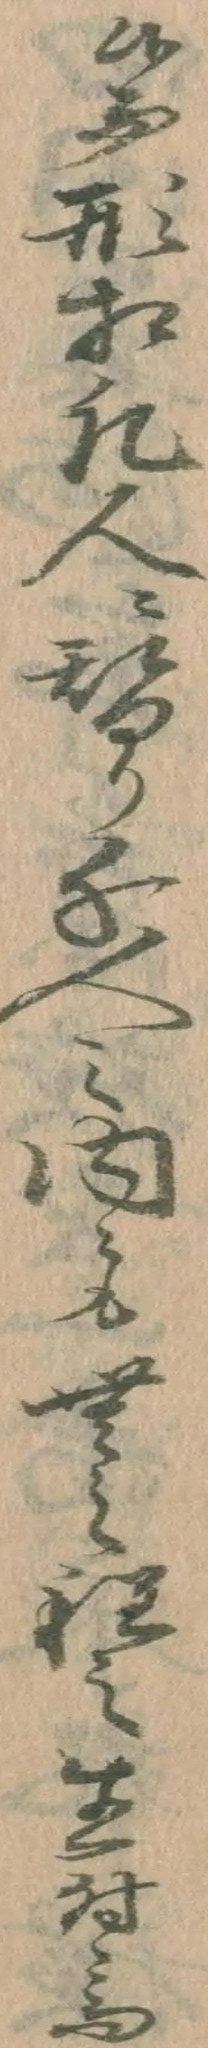候而形相凡人に替り千人之内にも無之程之生付に而
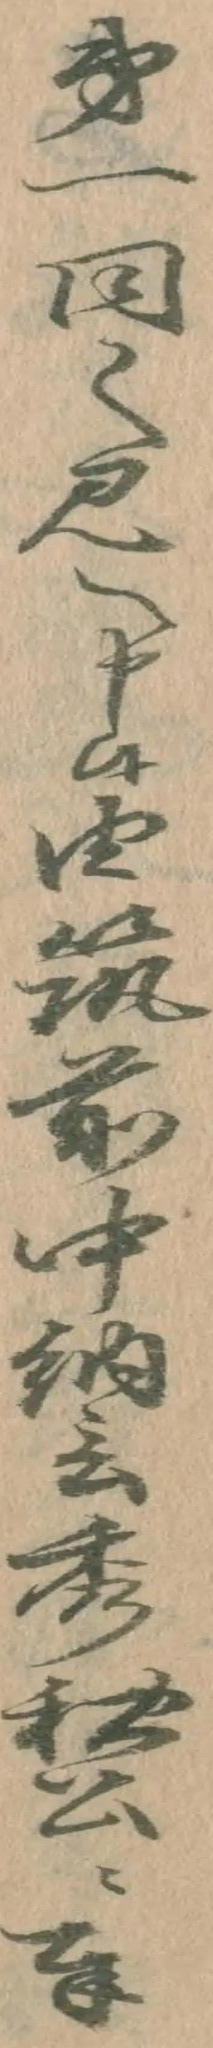第一同く見へ申候由筑前中納言秀秋公に奉
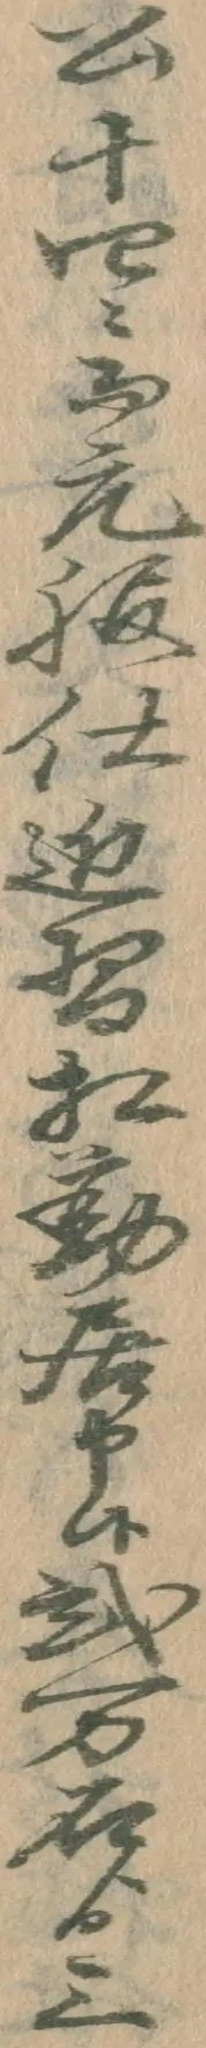公十四に而元服仕近習相勤居申候弐万石ゟ三
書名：切支丹御退治記 49巻. [8]
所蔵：国立国会図書館 National Diet Library, JAPAN
